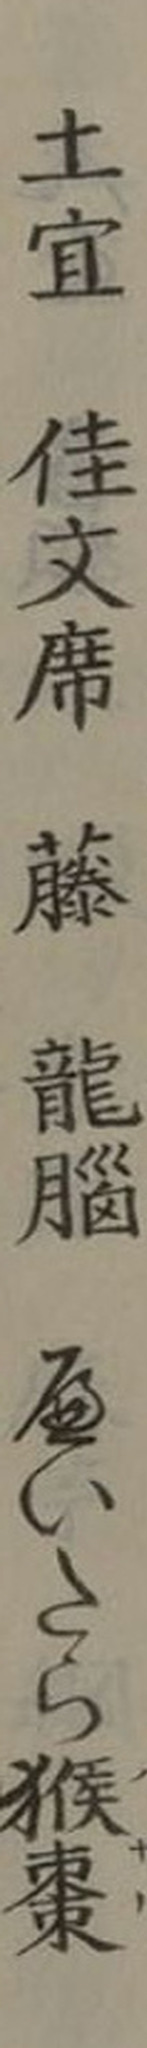土宜佳文席藤龍腦へいたら猴棗
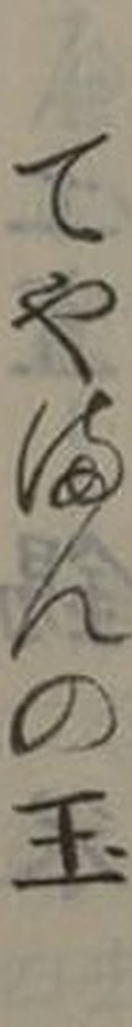てやマんの玉
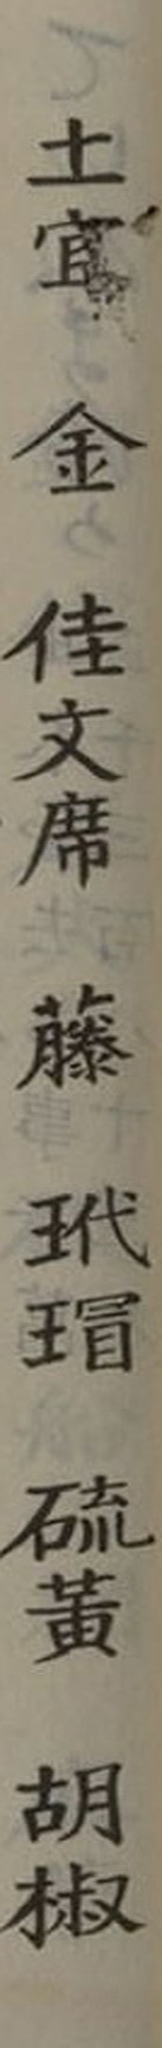土宜金佳文席藤玳瑁硫黃胡椒
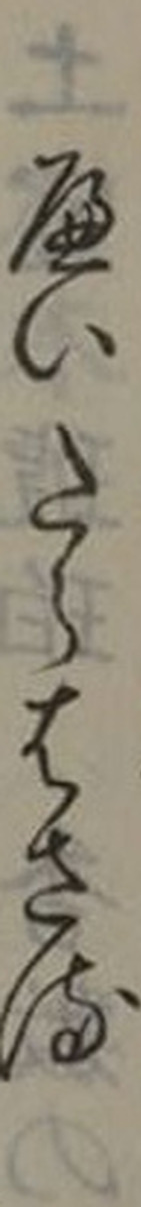へいたらはさま
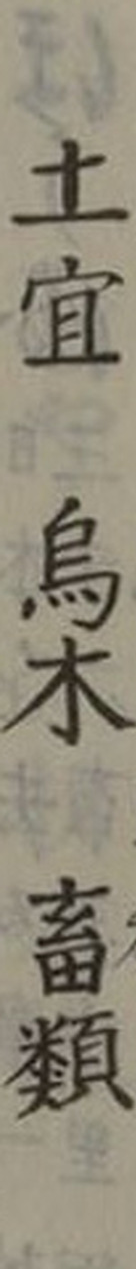土宜烏木畜類
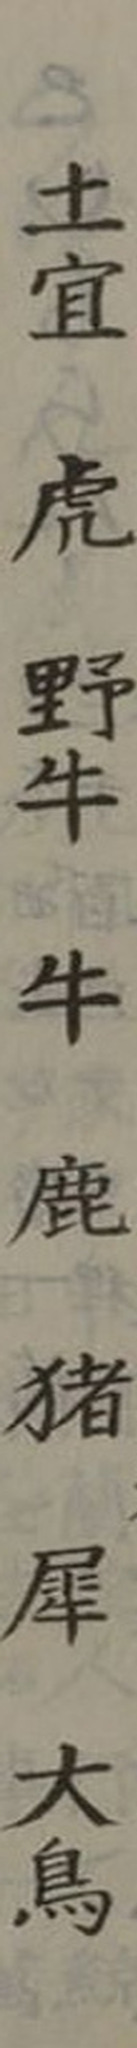土宜虎野牛牛鹿猪犀大鳥
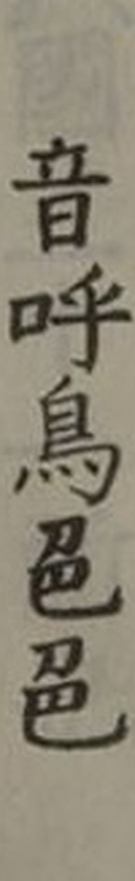音呼鳥色色

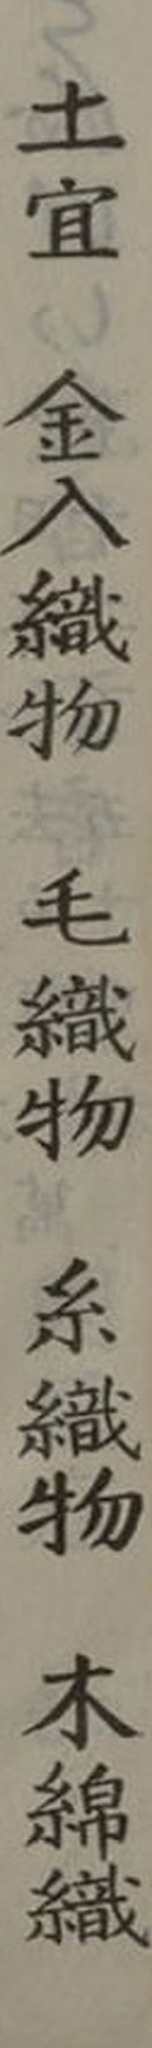土宜金入織物毛織物糸織物木綿織
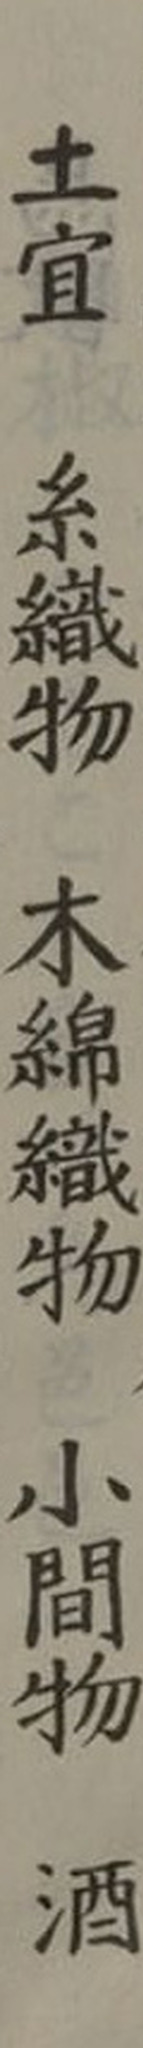土宜糸織物木綿織物小間物酒
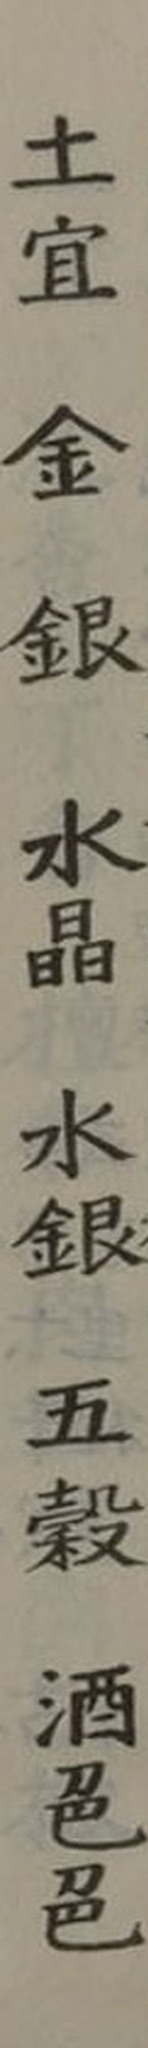土宜金銀水晶水銀五穀酒色色
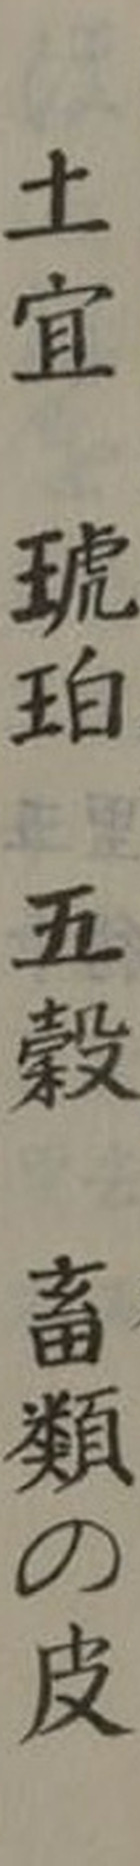土宜琥珀五穀畜類の皮
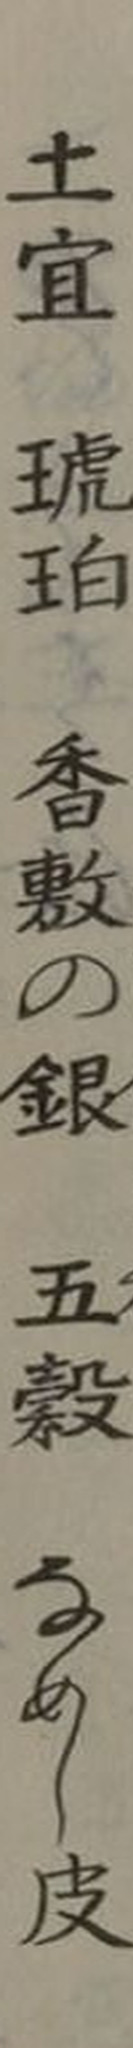土宜琥珀香敷の銀五穀なめし皮
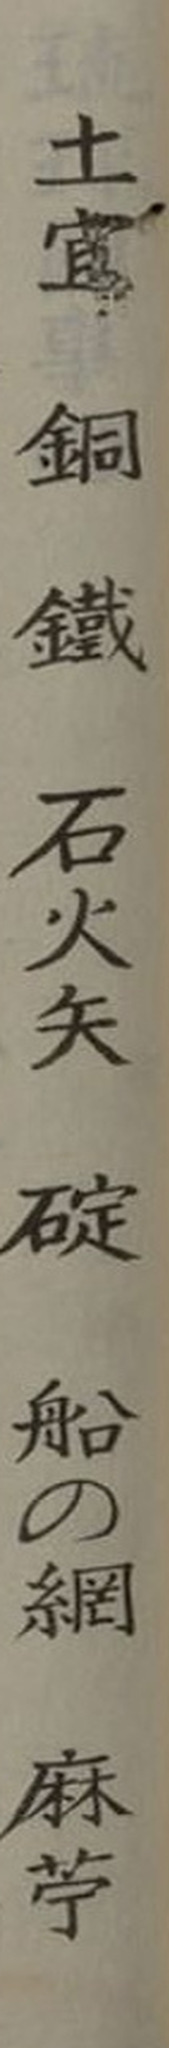土宜銅鐵石火矢碇船の網麻苧
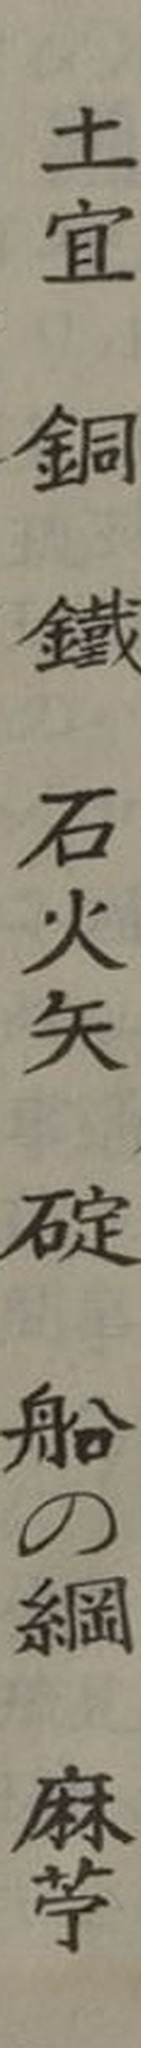土宜銅鐵石火矢碇船の網麻苧
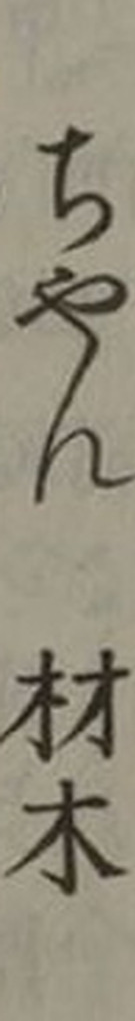ちやん材木
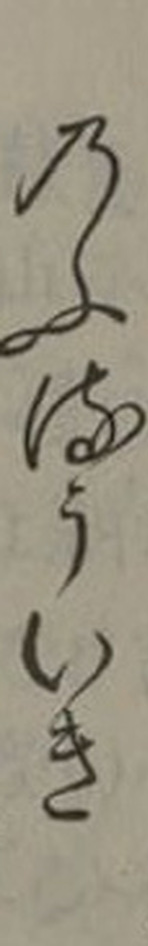のふるういき
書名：骨董録
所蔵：University of the Ryukyus Library
